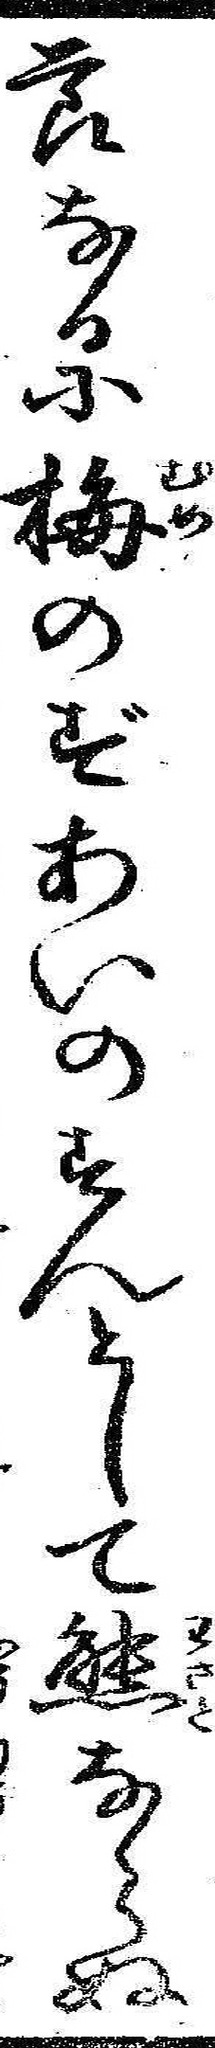節なるに梅のずあいのすんとして態ならぬ
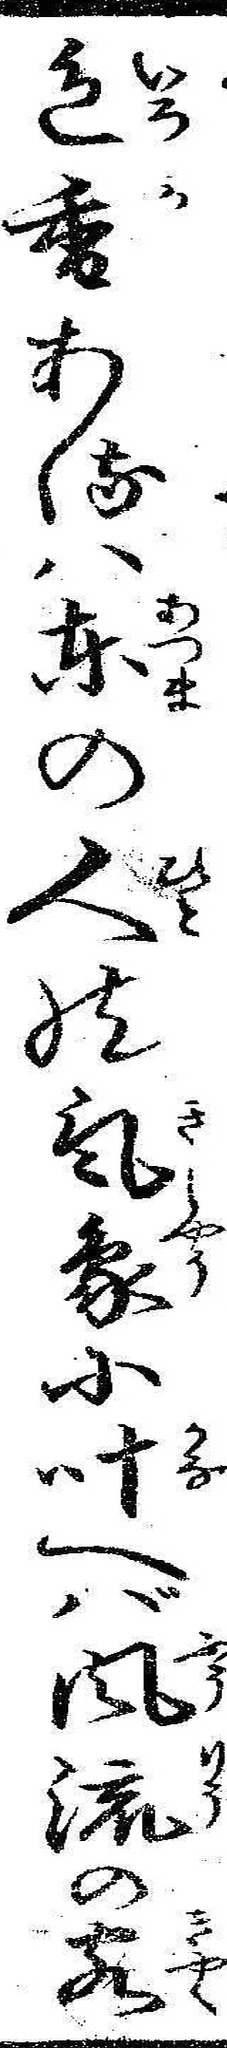色香あるは東の人の気象に叶へば風流の客
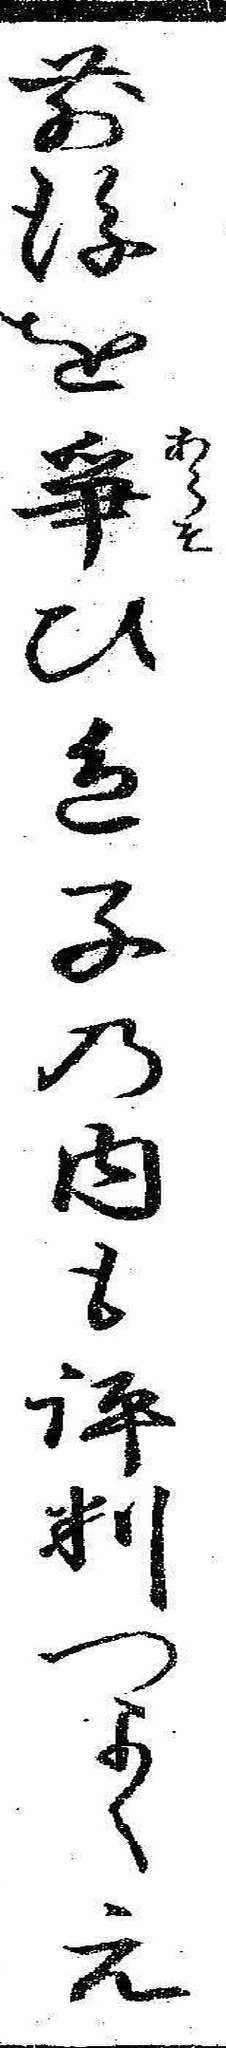前後を争ひ色子の内も評判つよく元

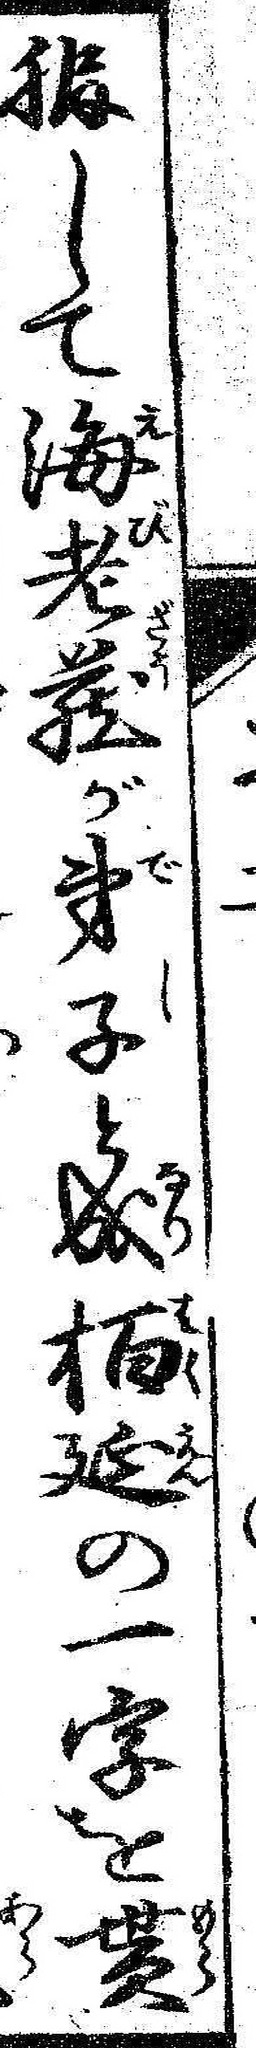服して海老蔵が弟子と成栢延の一字を貰
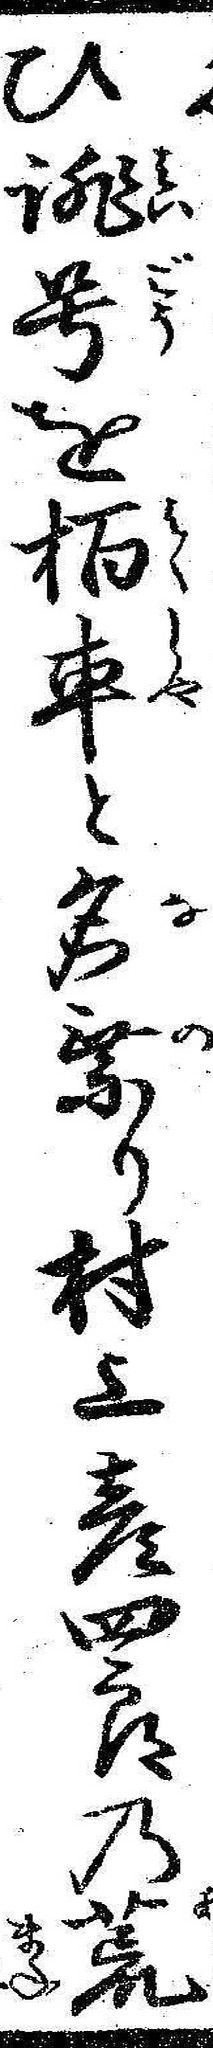ひ俳号を栢車と名乗り村上彦四郎の荒
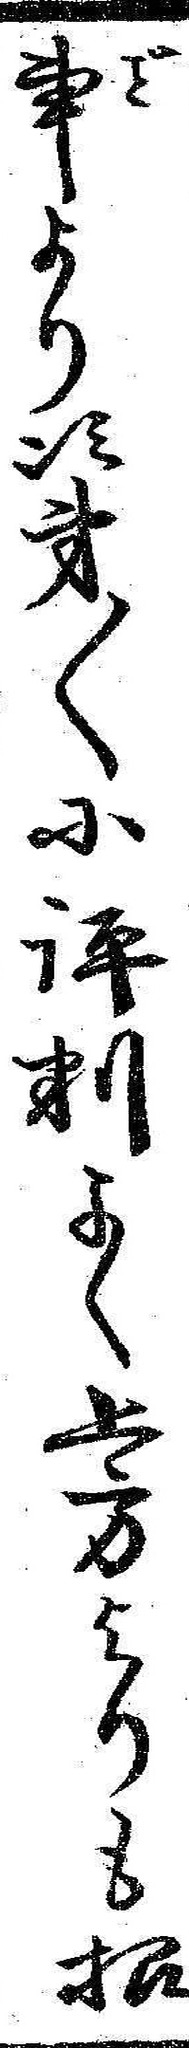事より次第〱に評判よく上方よりも招
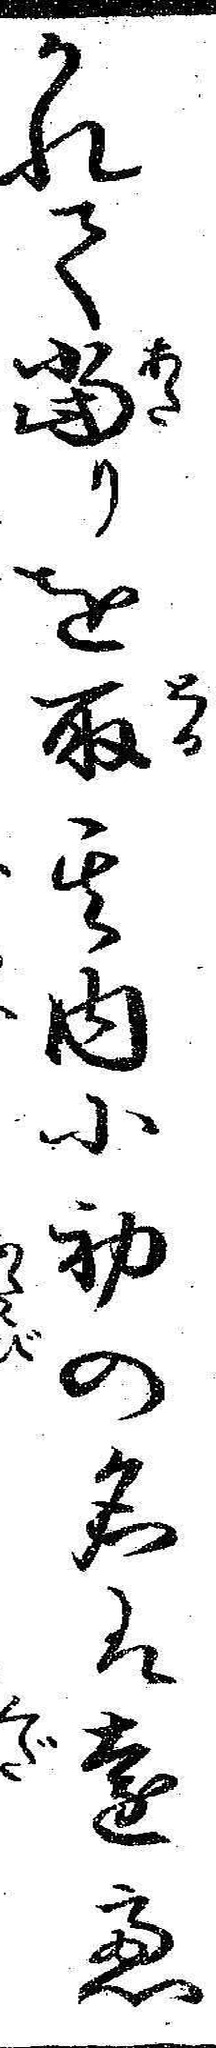かれて当りを取其内に初の名は遠慮
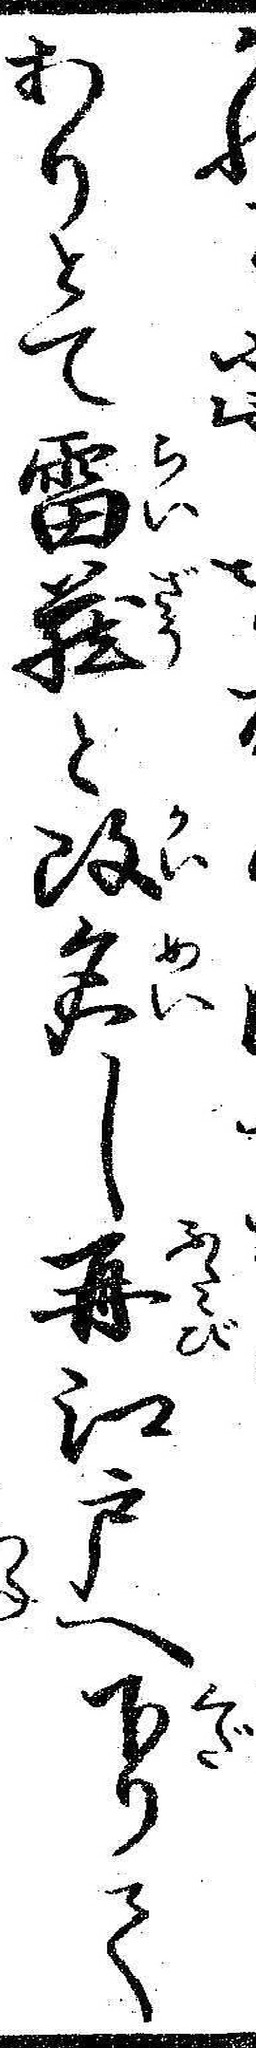ありとて雷蔵と改名し再江戸へ下りて
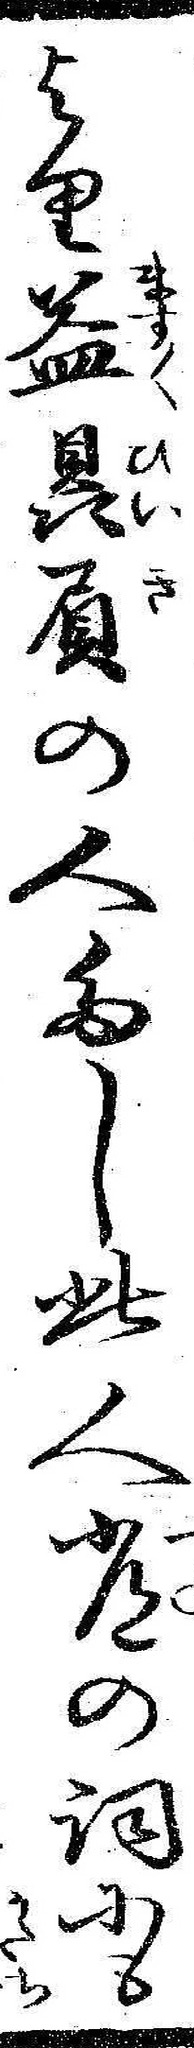より益贔屓の人多し此人常の詞にも
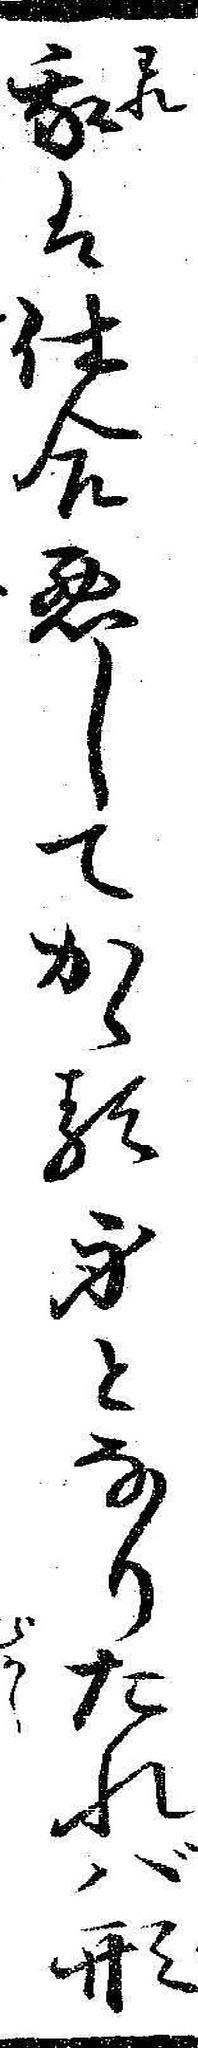我は仕合悪してかゝる身となりたれば形
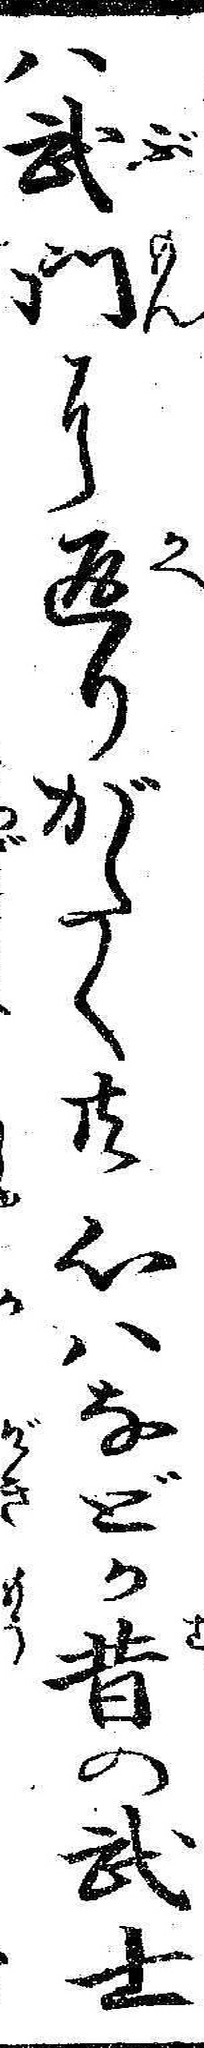は武門に返りがたく共心はなどか昔の武士
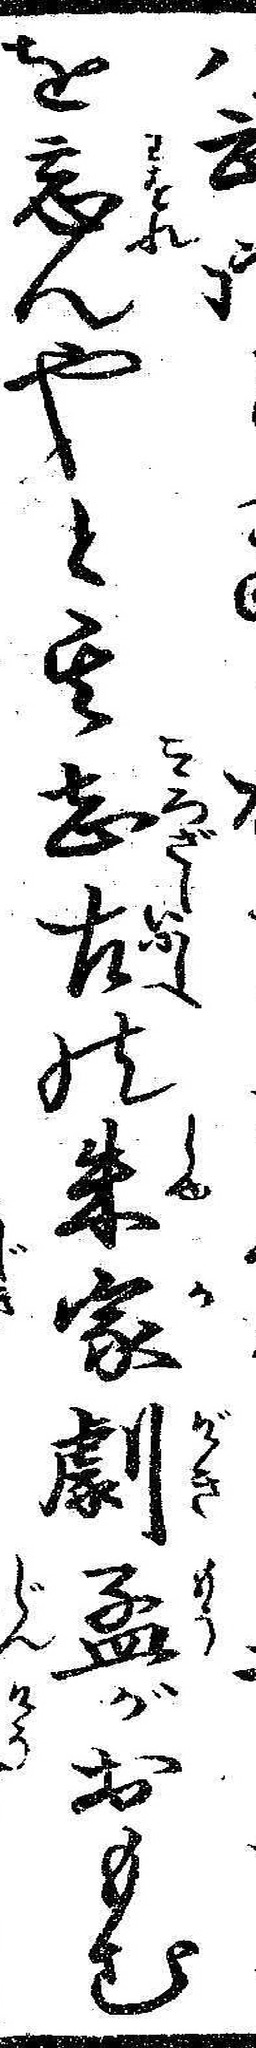を忘んやと其志古の朱家劇孟がおもむ
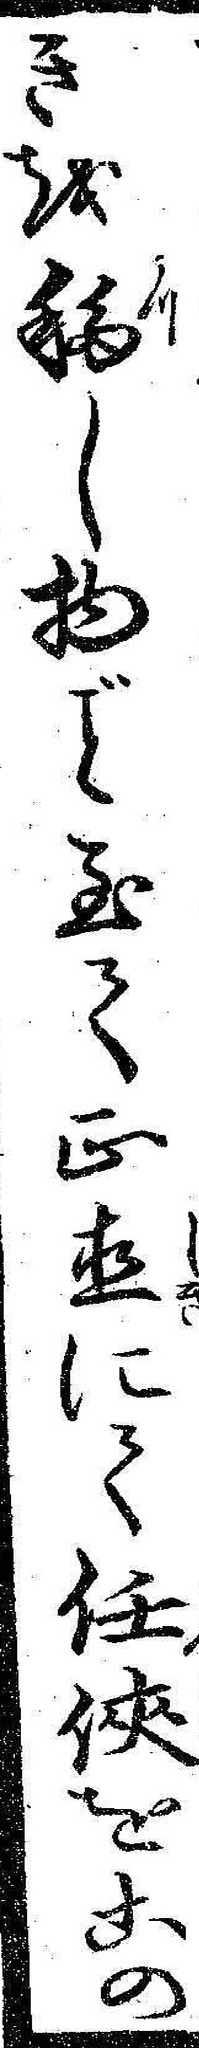きを移し物ごと至て正直にて任侠をこの
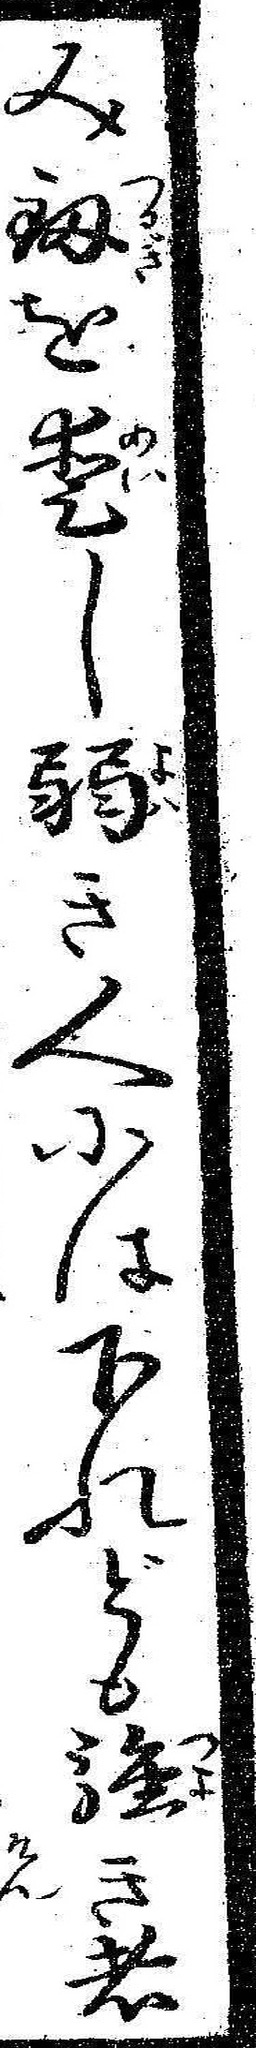み剣を愛し弱き人には下れども強き者
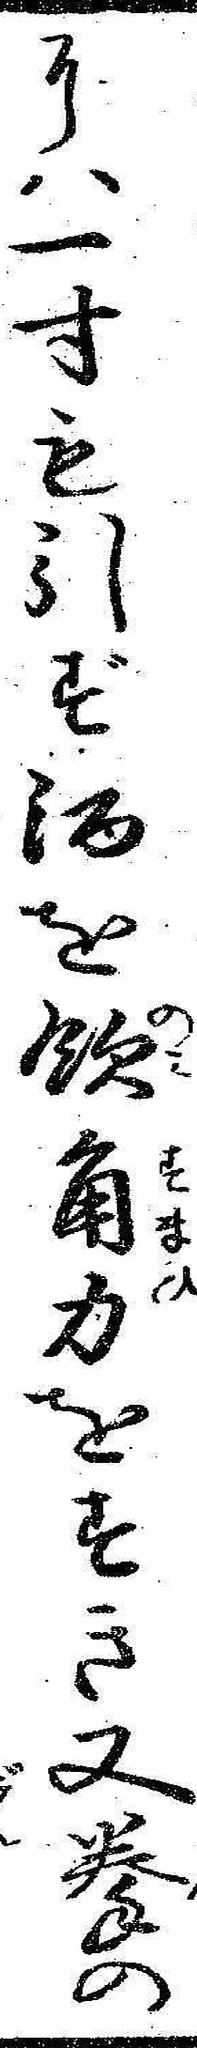には一寸も引ず酒を飲角力をすき又拳の
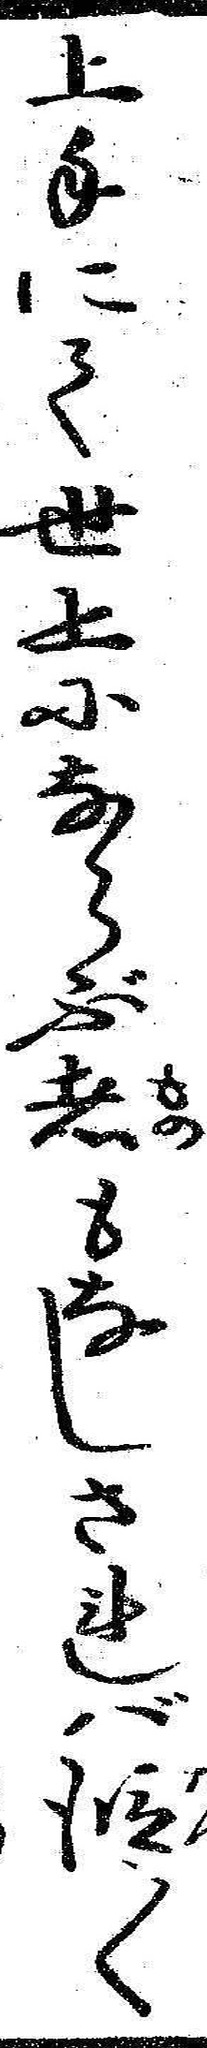上手にて世上にならぶ者もなしされば段〱
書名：根無草後編
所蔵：国文学研究資料館
